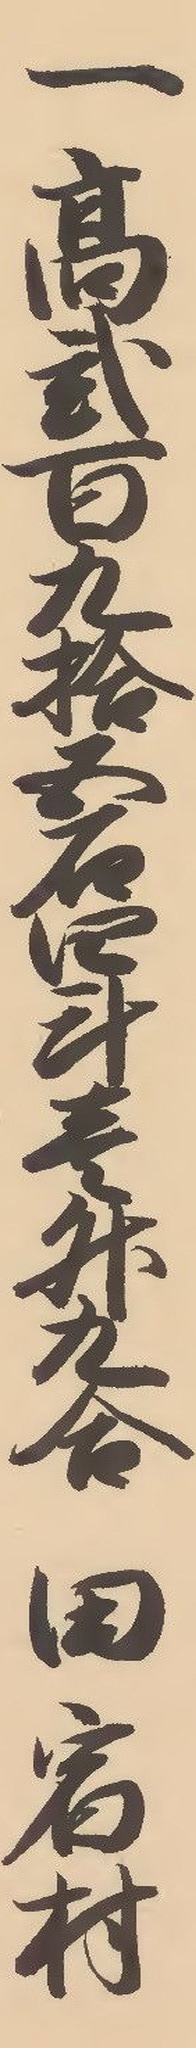一高弐百九拾五石四斗壱升九合田宿村
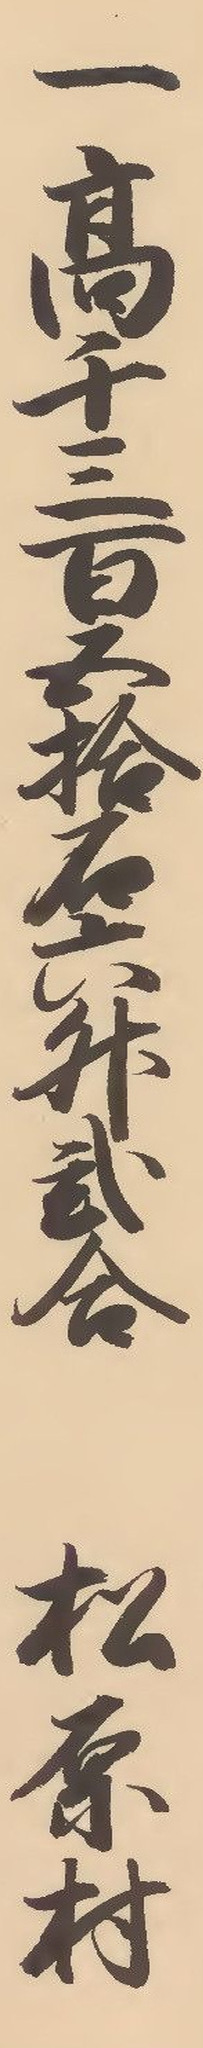一高千三百五拾石六升弐合松原村
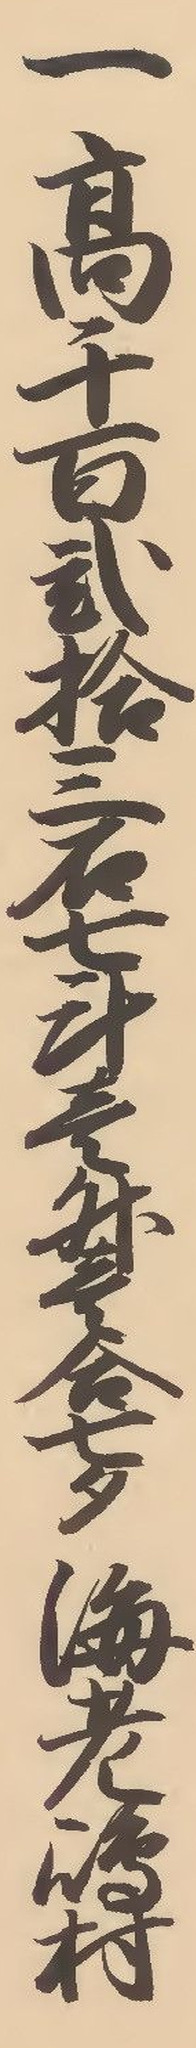一高千百弐拾三石七斗壱升壱合七勺海老島村

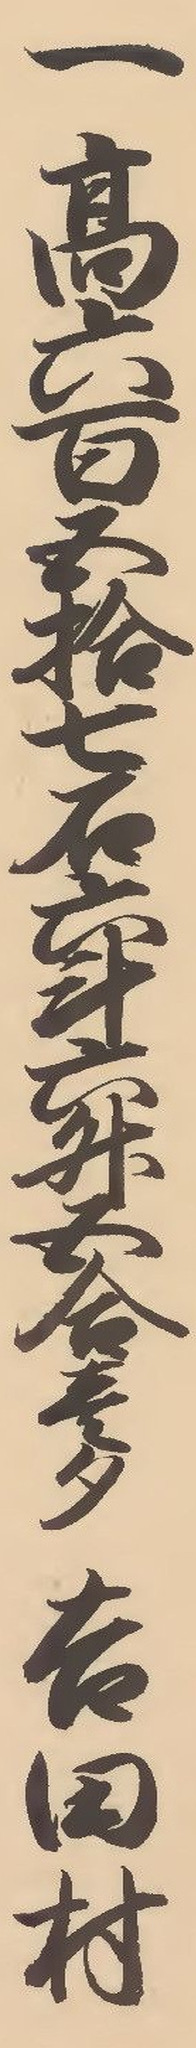一高六百五拾七石六斗六升五合壱勺吉田村
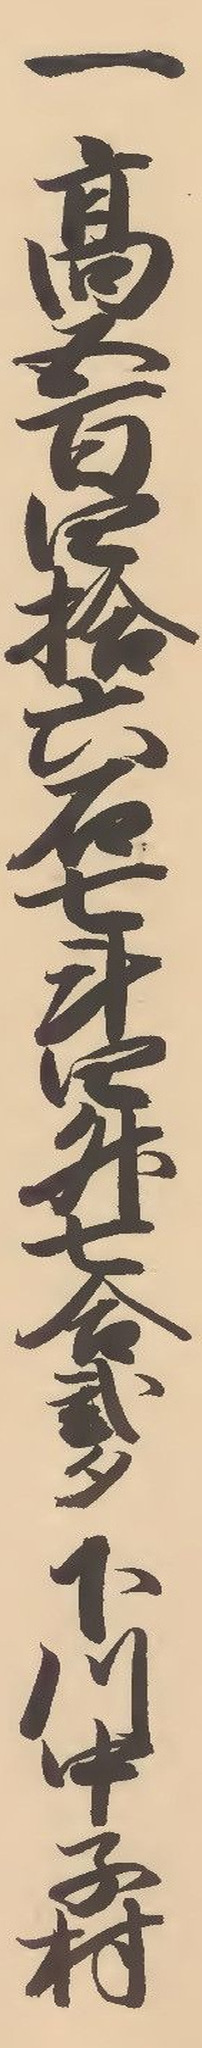一高五百四拾六石七斗四升七合弐勺下川中子村
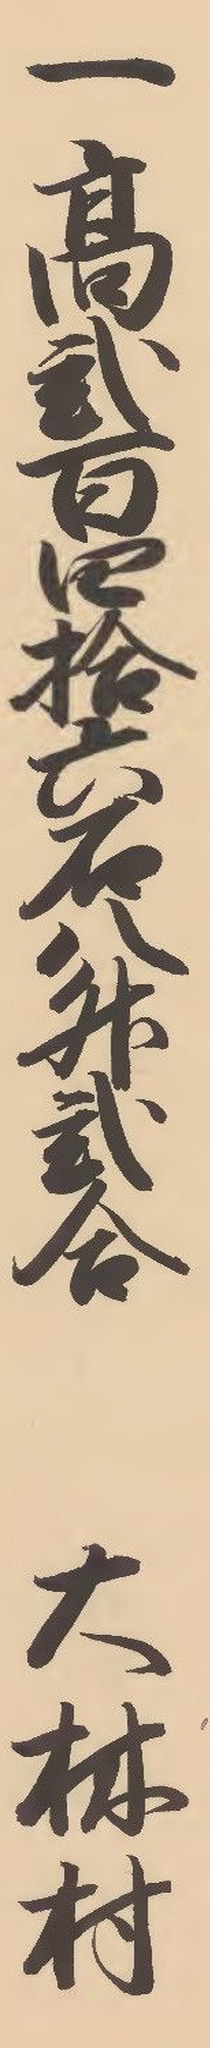一高弐百四拾六石八升弐合大林村
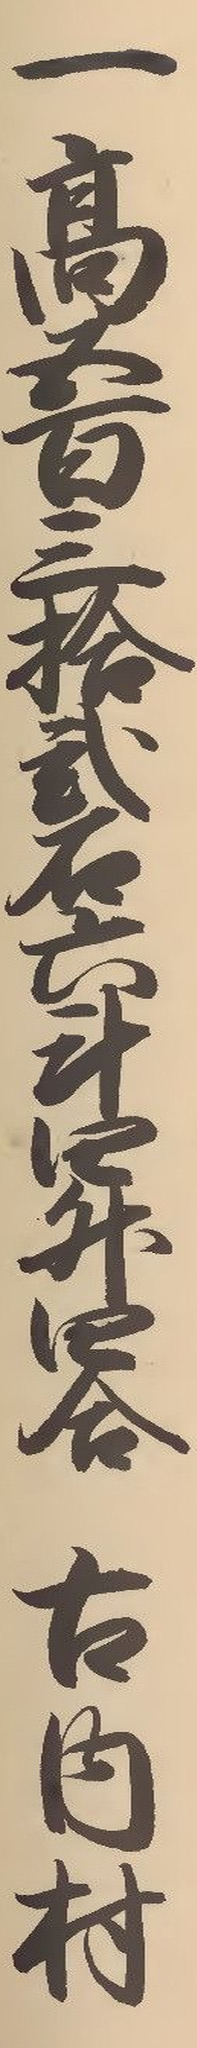一高五百三拾弐石六斗四升四合古内村
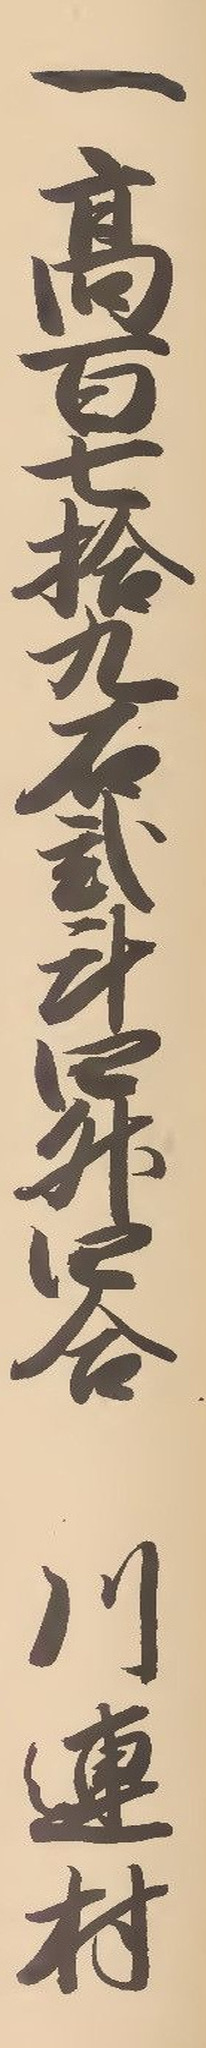一高百七拾九石弐斗四升四合川連村
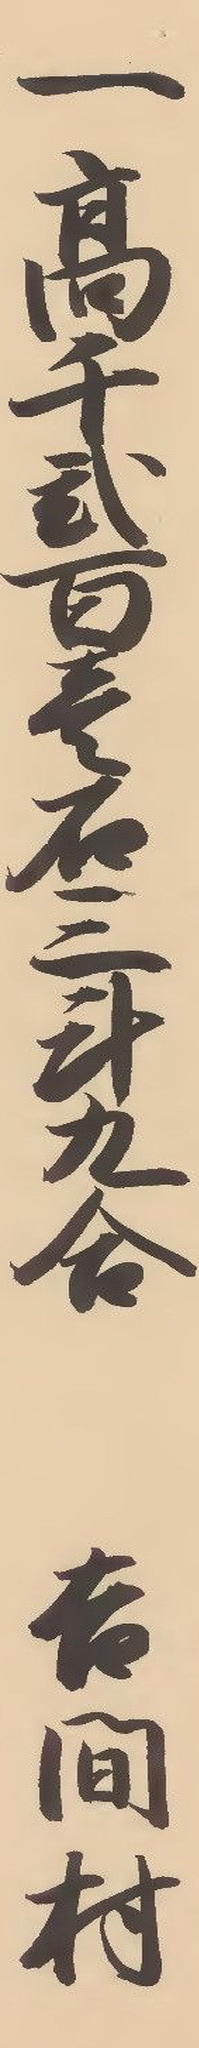一高千弐百壱石三斗九合吉間村
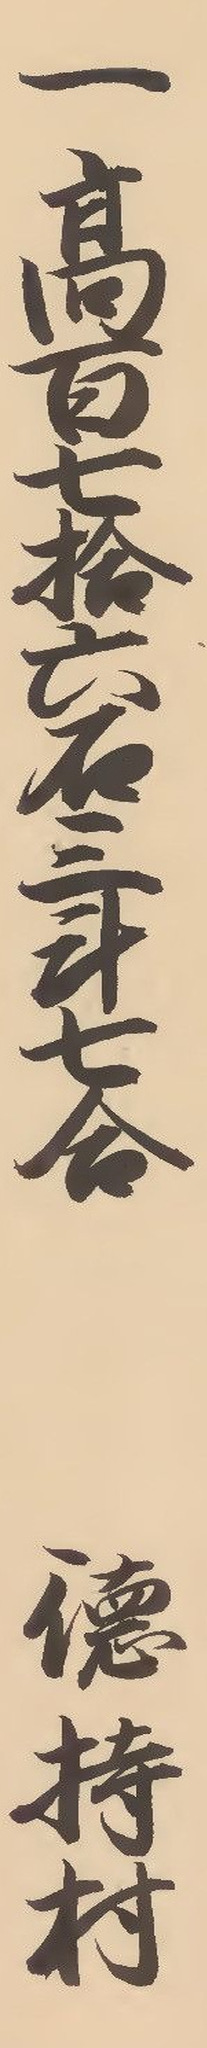一高百七拾六石三斗七合徳持村
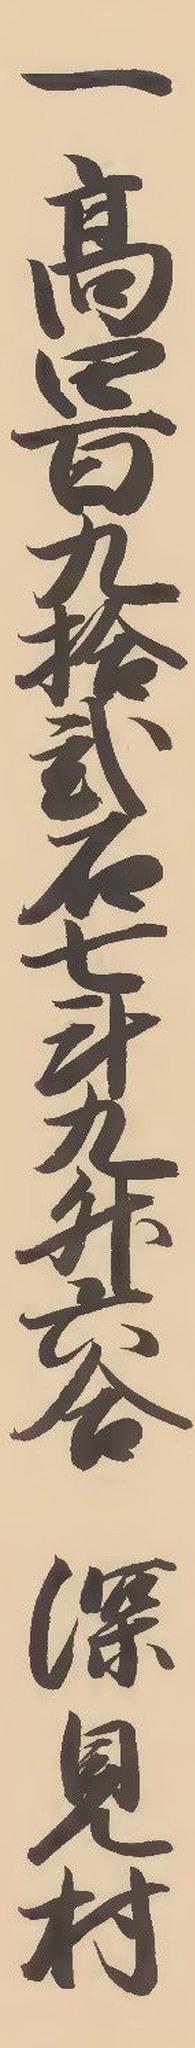一高四百九拾弐石七斗九升六合深見村

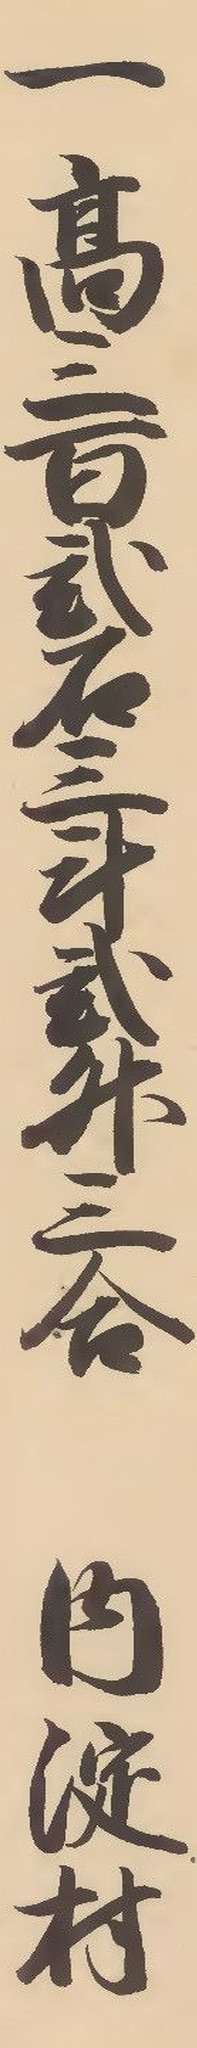一高三百弐石三斗弐升三合内淀村
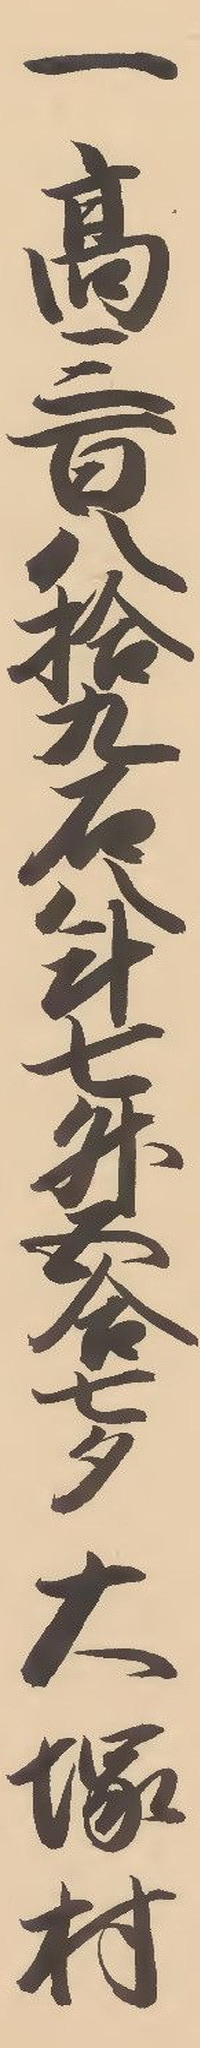一高三百八拾九石八斗七升五合七勺大塚村
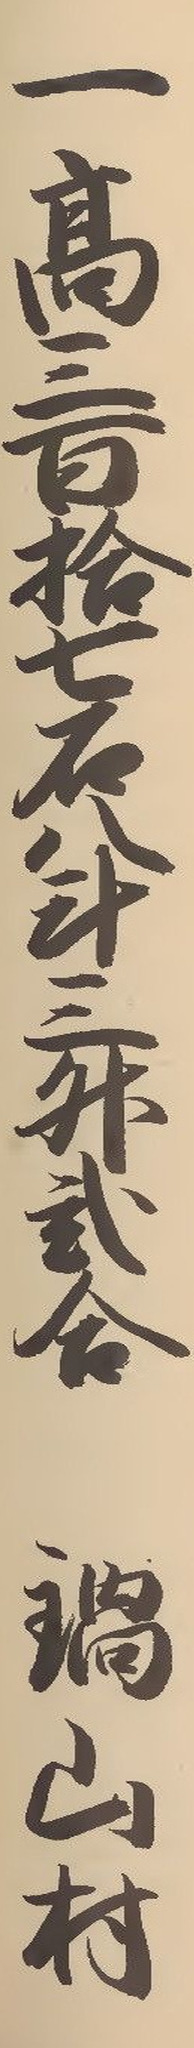一高三百拾七石八斗三升弐合鍋山村
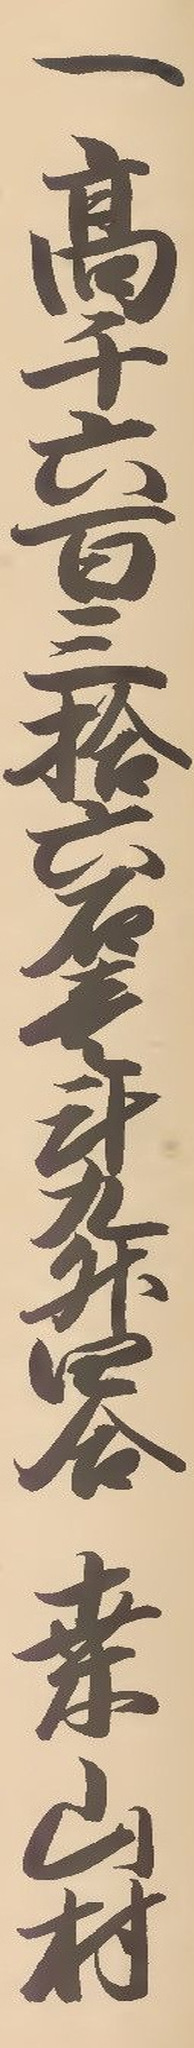一高千六百三拾六石壱斗九升四合桑山村
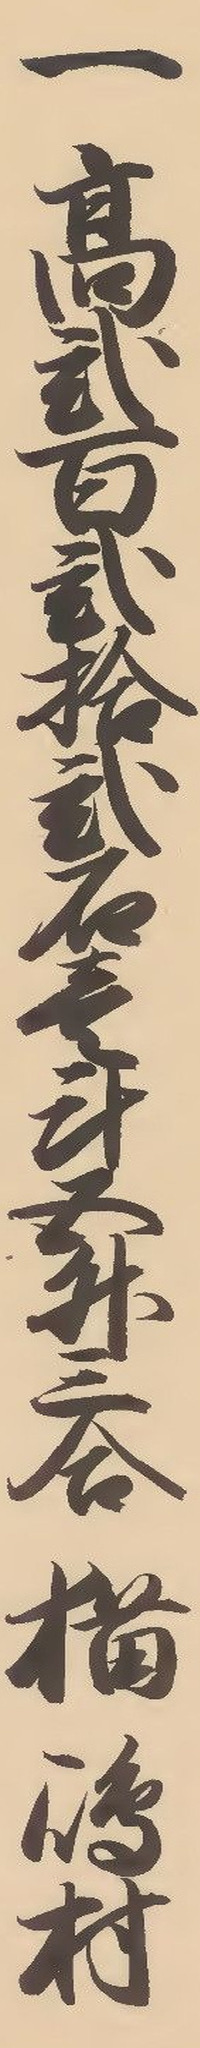一高弐百弐拾弐石壱斗五升三合猫島村
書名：常陸国郷帳
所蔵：国立公文書館 National Archives of Japan
